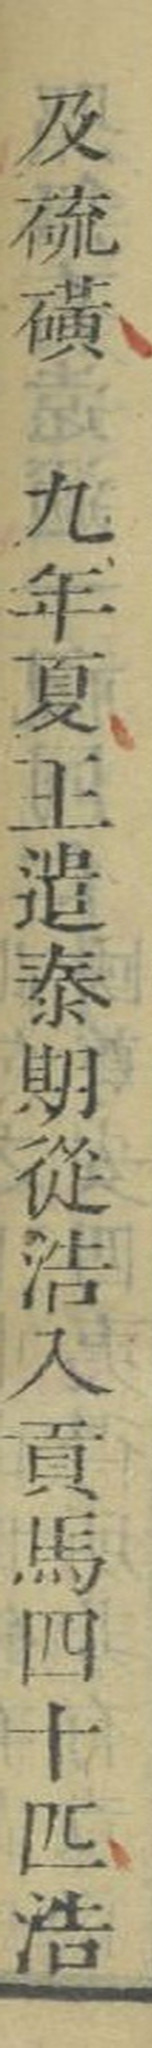及硫磺九年夏王遣泰期従浩入貢馬四十匹浩
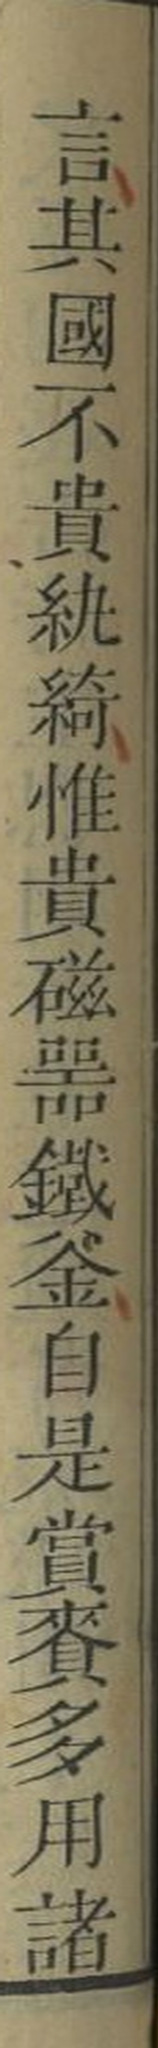言其国不貴紈綺惟貴磁器鉄釜自是賞賚多用諸
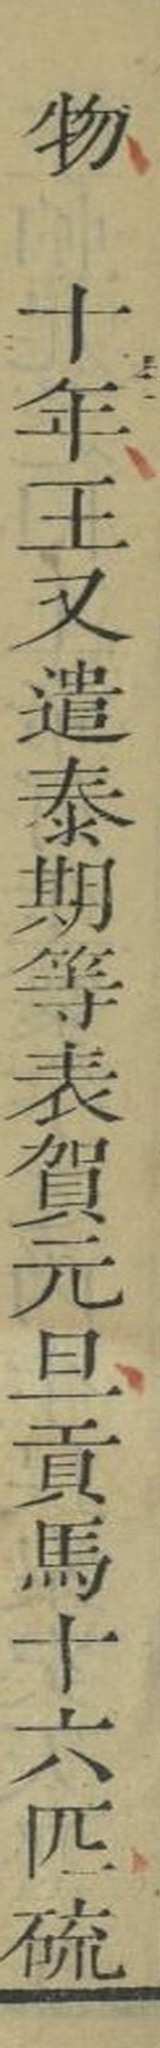物十年王又遣泰期等表賀元旦貢馬十六匹硫
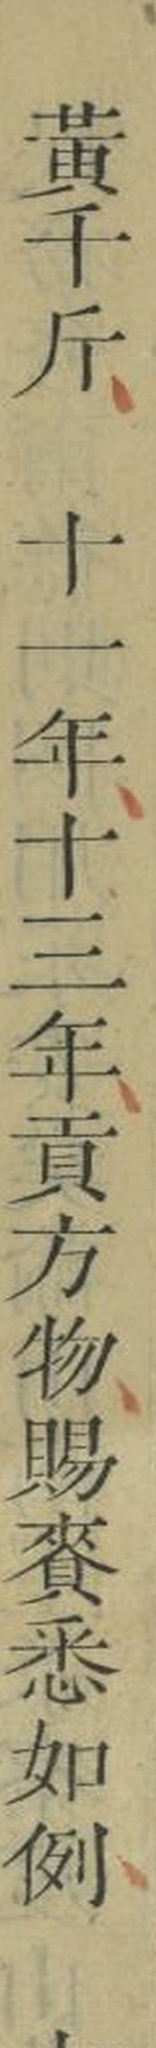黄千斤十一年十三年貢方物賜賚悉如例十
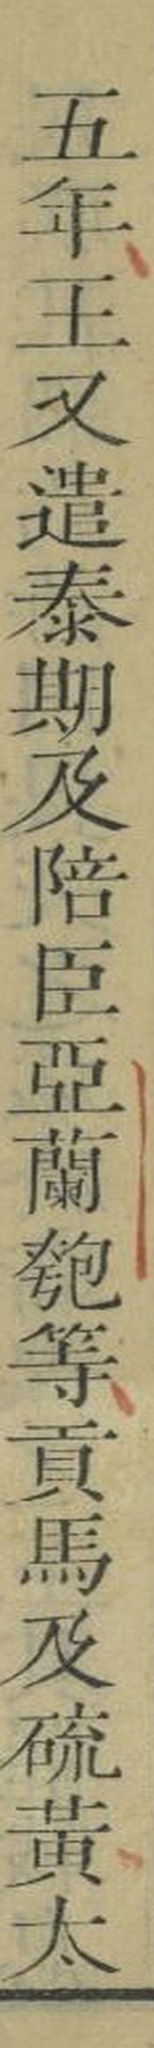五年王又遣泰期及陪臣亜蘭匏等貢馬及硫黄太
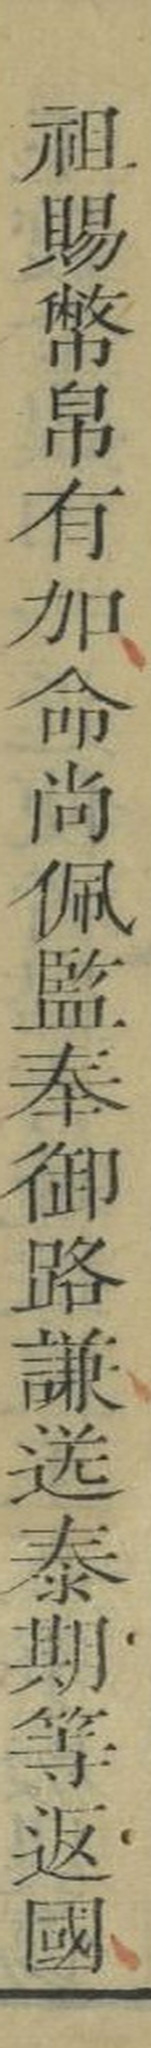祖賜幣帛有加命尚佩監奉御路謙送泰期等返国
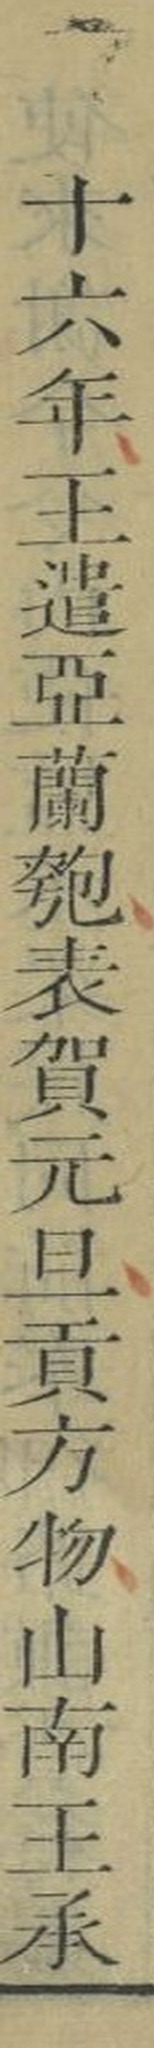十六年王遣亜蘭匏表賀元旦貢方物山南王承
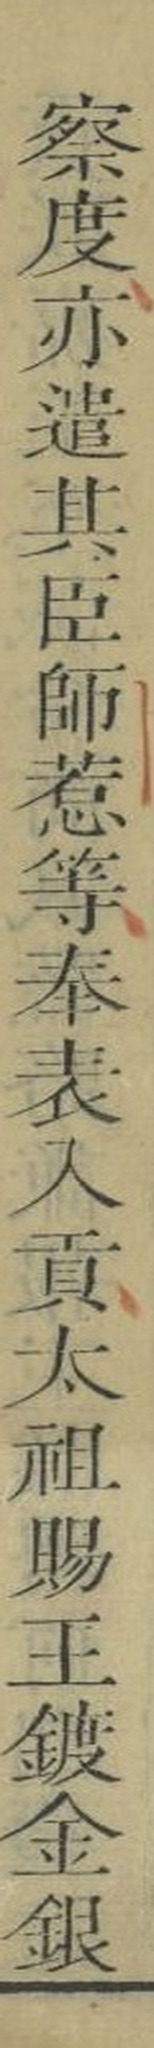察度亦遣其臣師惹等奉表入貢太祖賜王鍍金銀
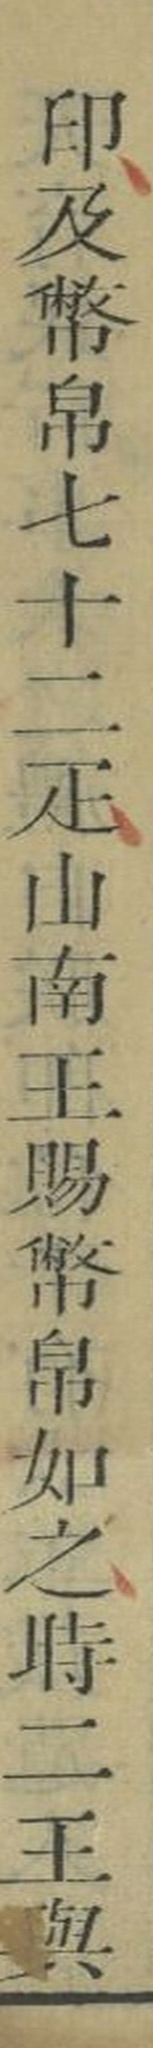印及幣帛七十二疋山南王賜幣帛如之時二王与
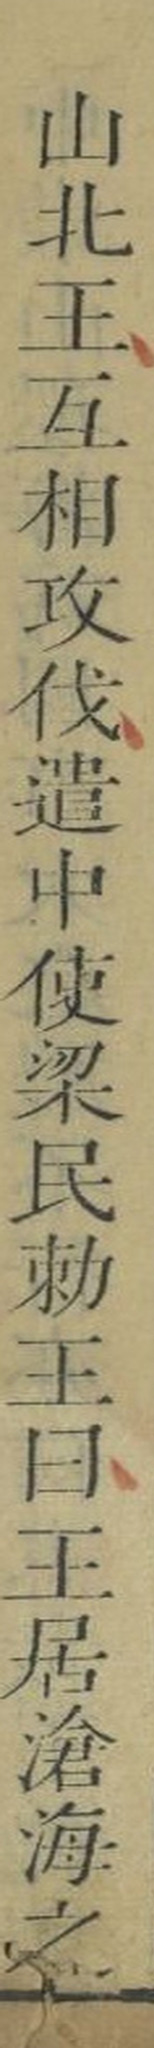山北王互相攻伐遣中使梁民勅王曰王居滄海之

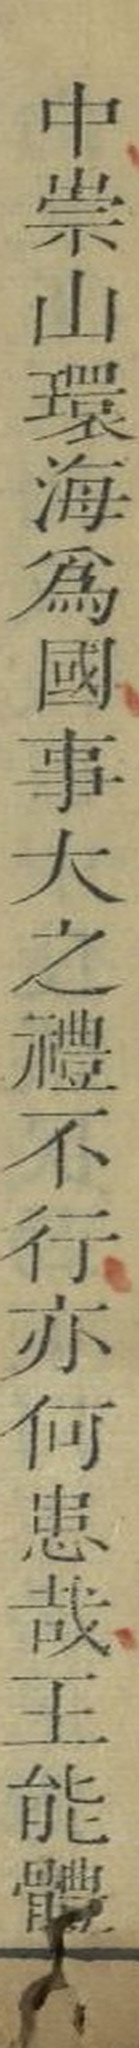中崇山環海為国事大之礼不行亦何患哉王能体
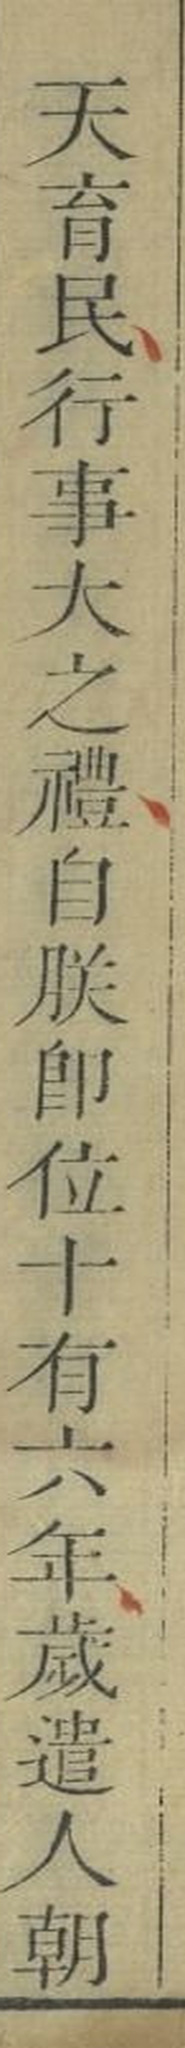天育民行事大之礼自朕即位十有六年歳遣人朝
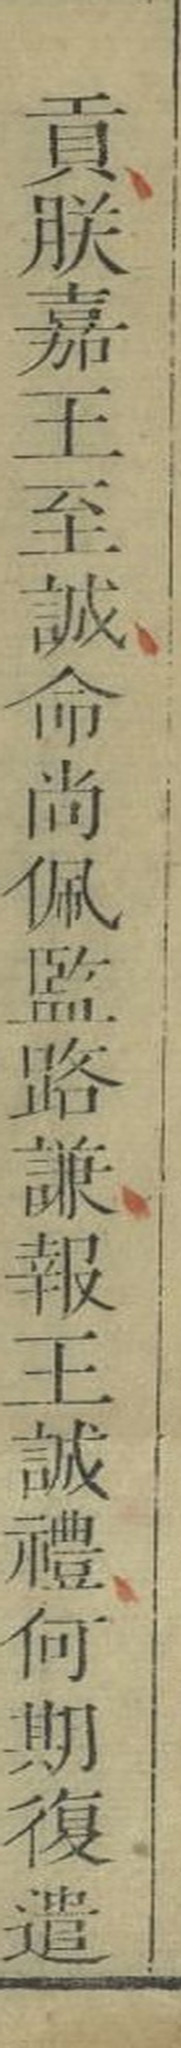貢朕嘉王至誠命尚佩監路謙報王誠礼何期復遣
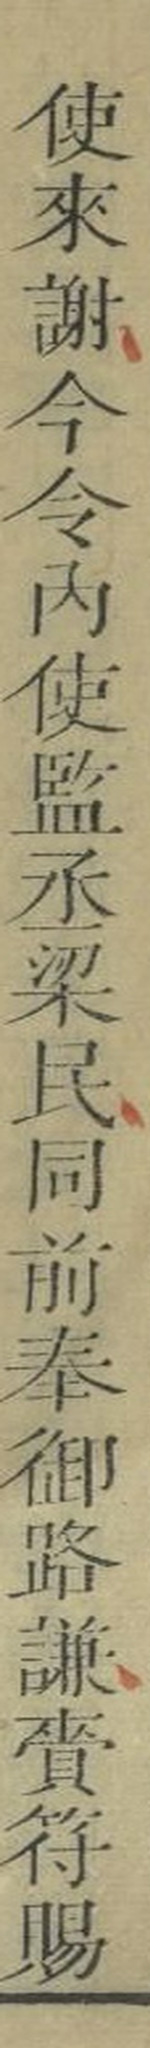使来謝今令内使監丞梁民同前奉御路謙賚符賜
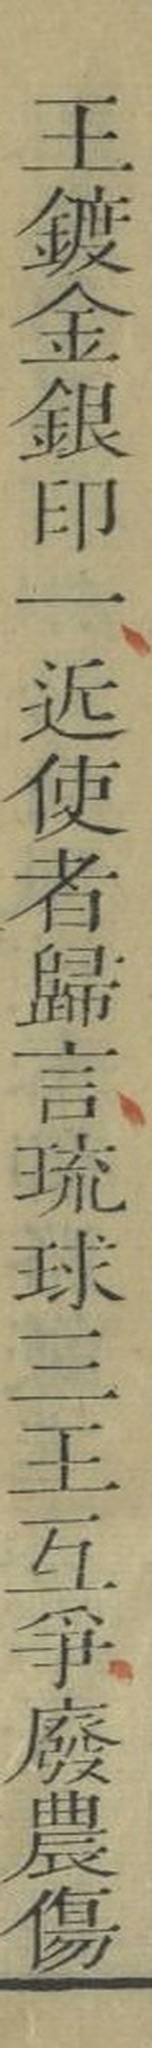王鍍金銀印一近使者帰言琉球三王互争廃農傷
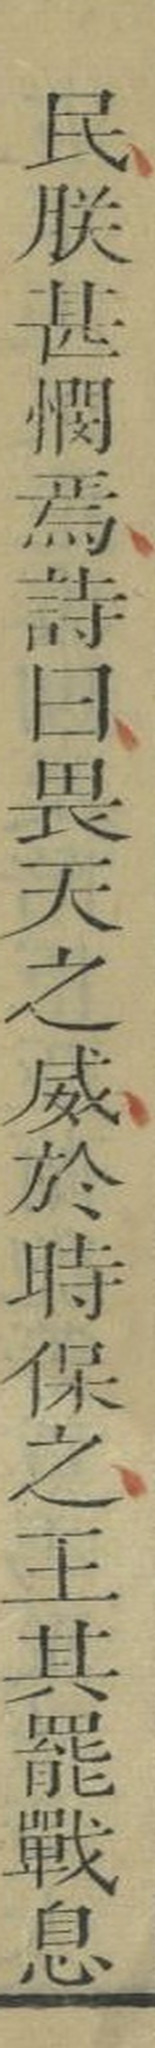民朕甚憫焉詩曰畏天之威於時保之王其罷戦息
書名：中山伝信録 巻三
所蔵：University of the Ryukyus Library
